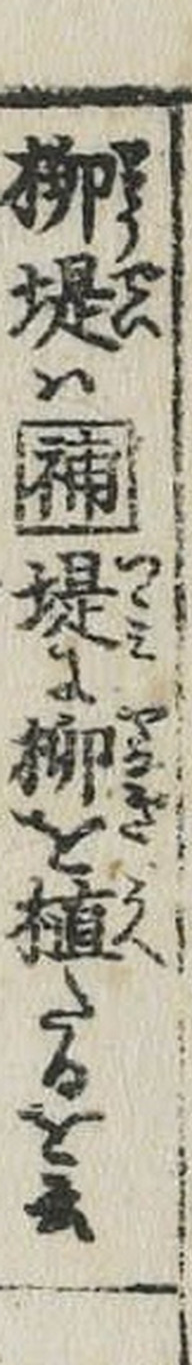柳堤は補堤に柳を植たるを云
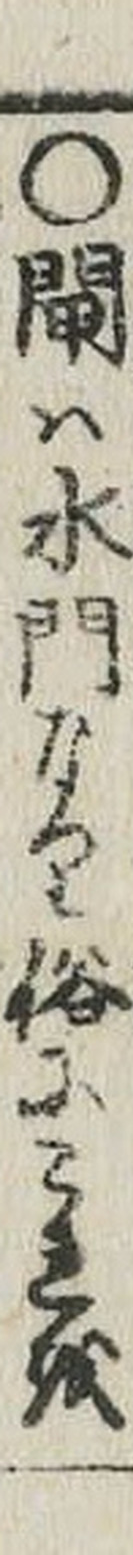○閘は水門なり俗にこれを
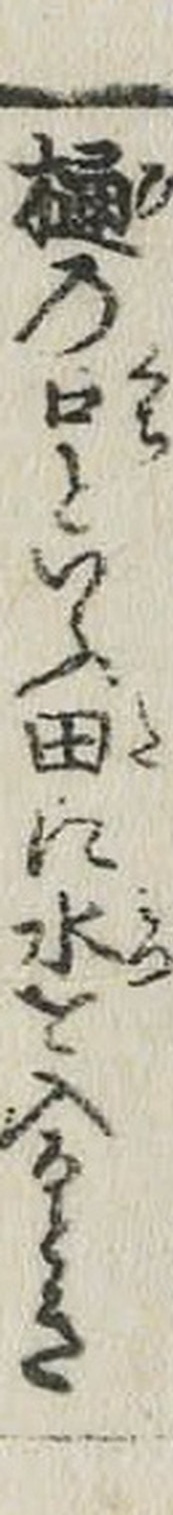樋の口といふ田に水を入るとき
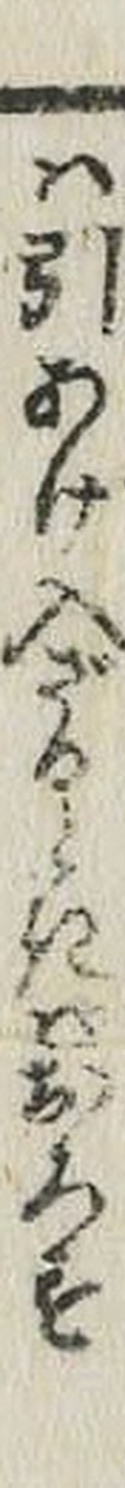は引あげ入ざるときはおろす
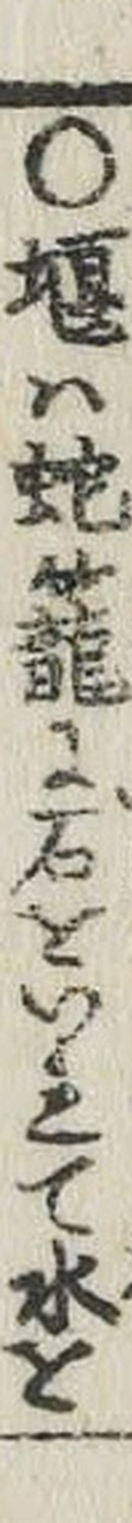○堰は蛇篭に石をいれて水を
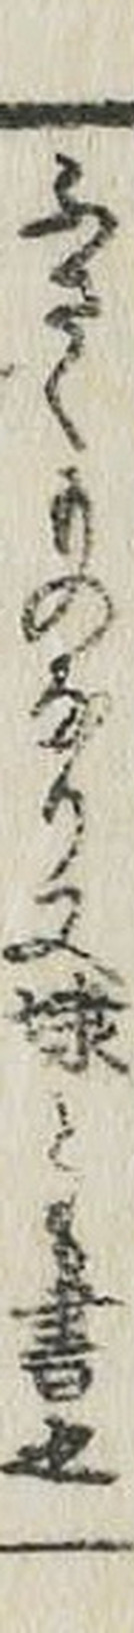ふさくものなり又埭とも書也
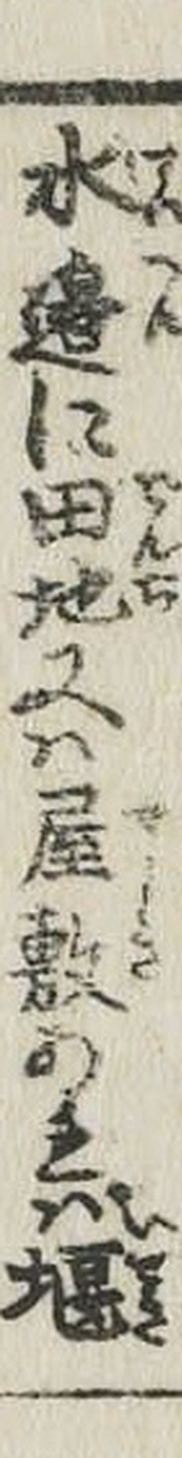水辺に田地又は屋敷あれば堰
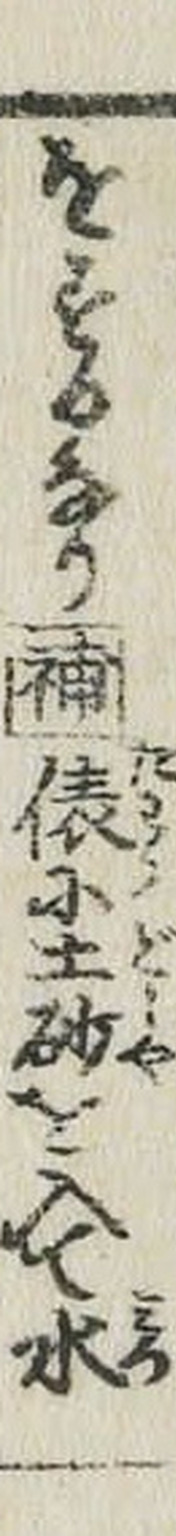をするなり補俵に土砂を入て水
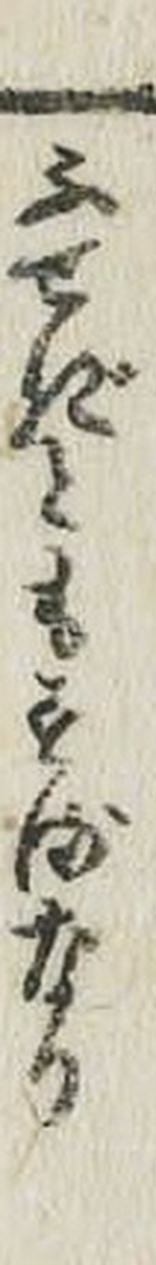ふせぎともするなり
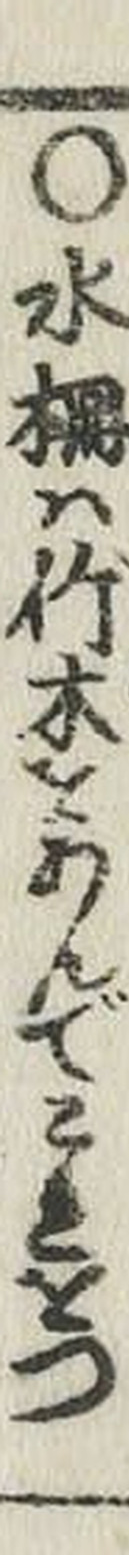○水柵は竹木をあんでこれをつ
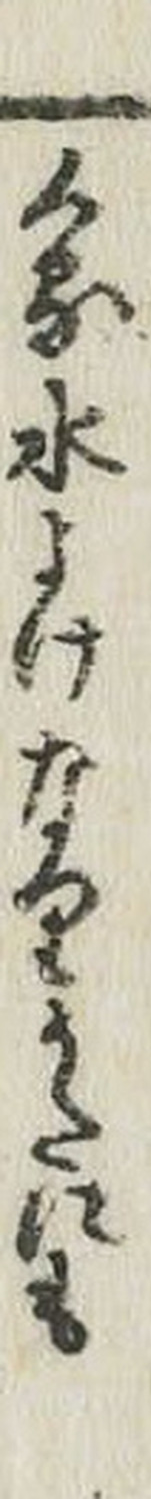くる水よけなりうたにも
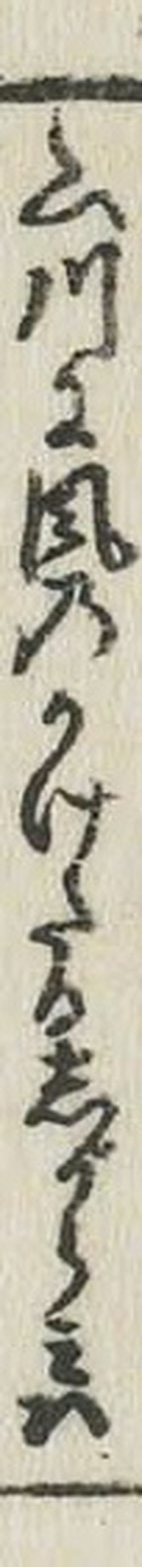山川に風のかけたるしがらみは
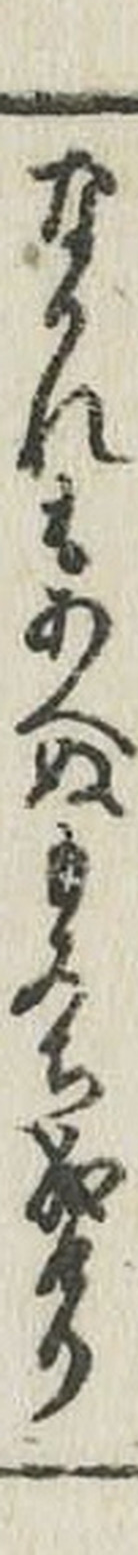なかれもあへぬもみち成けり
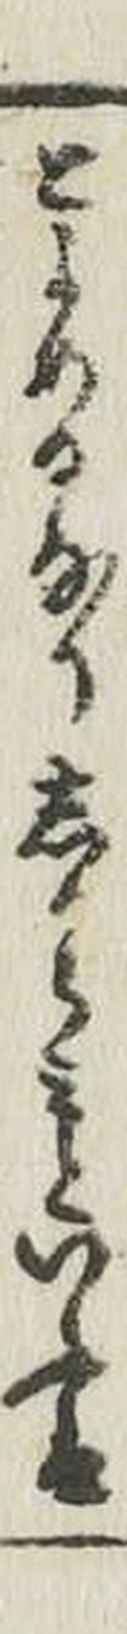とよめるなりしからみといふは
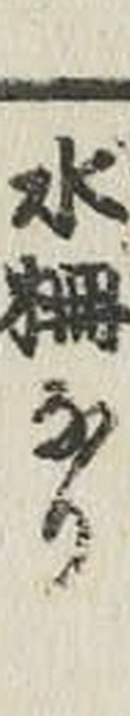水柵なり
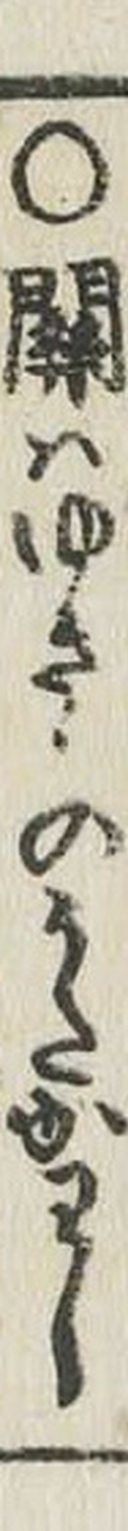○関はゆきゝのうたかわし
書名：増補頭書訓蒙図彙大成 10巻 2:巻之1-3
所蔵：東京学芸大学教育コンテンツアーカイブ
